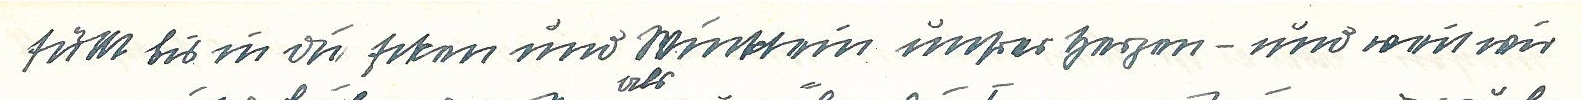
füllt bis in die Ecken und Winklein unsrer Herzen – und weil wir
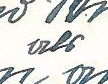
als
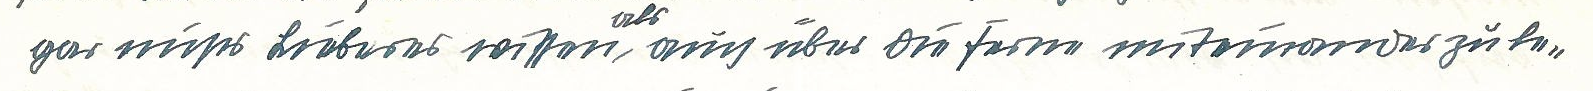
gar nichts Lieberes wissen, auch über die Ferne miteinander zu le¬
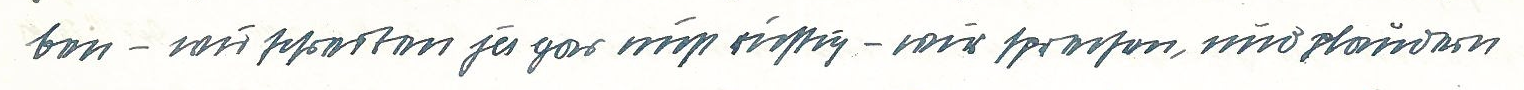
ben – wir schreiben ja gar nicht richtig – wir sprechen, und plaudern
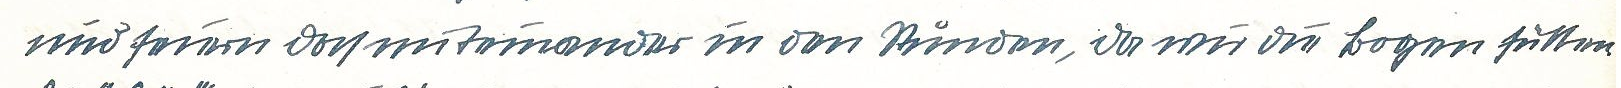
und feiern doch miteinander in den Stunden, da wir die Bogen füllen.
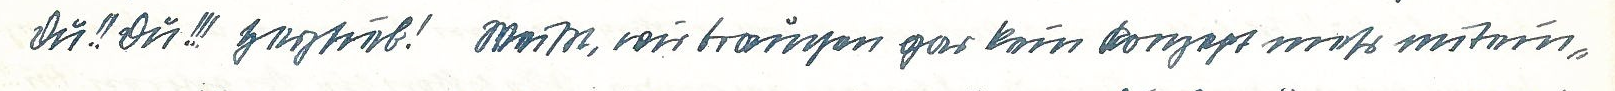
Du!! Du!!! Herzlieb! Weißt, wir brauchen gar kein Konzept mehr mitein¬
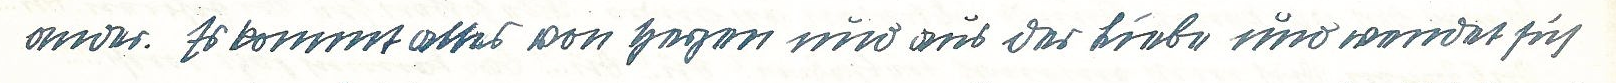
ander. Es kommt alles von Herzen und aus der Liebe und wendet sich
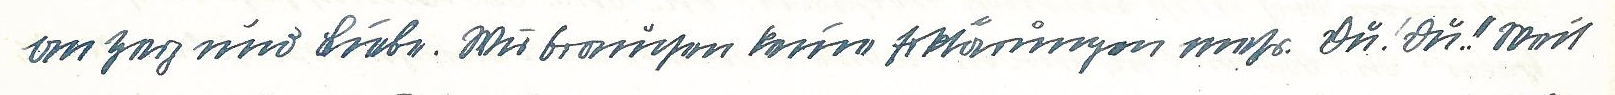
an Herz und Liebe. Wir brauchen keine Erklärungen mehr. Du! Du!! Weil
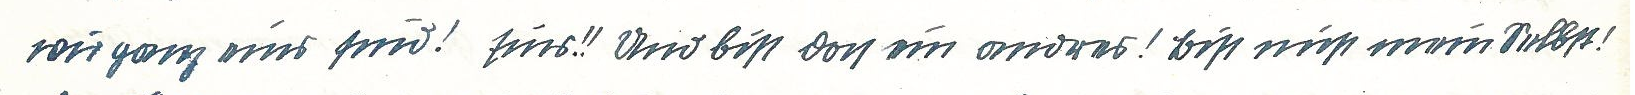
wir ganz eins sind! Eins!! Und bist doch ein andres! Bist nicht mein Selbst!
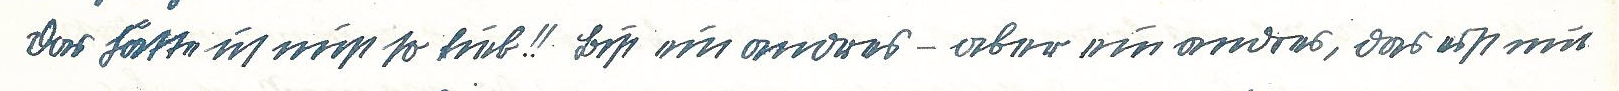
Das hätte ich nicht so lieb!! Bist ein andres – aber ein andres, das erst mit
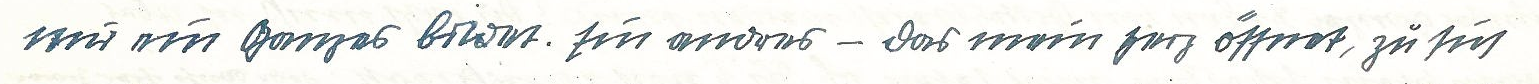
mir ein Ganzes bildet. Ein andres – das mein Herz öffnet, zu sich
